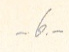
-6.-
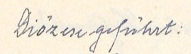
Diözese geführt:
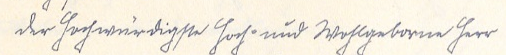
Der hochwürdigste hoch- und wohlgeborne Herr
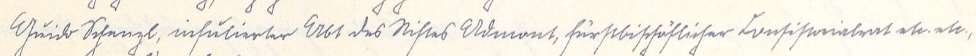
Guido Schenzl, insultierter Abt des Stiftes Admont, fürstbischöflicher Consistorialrat etc. etc.,
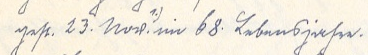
gest. 23. Nov. im 68. Lebensjahre.
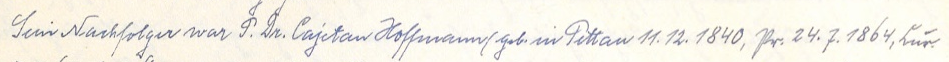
Sein Nachfolger war P. Dr. Cajetan Hoffmann (geb. in Pettau 11.12.1840, Pr. 24.7. 1864, Cur.
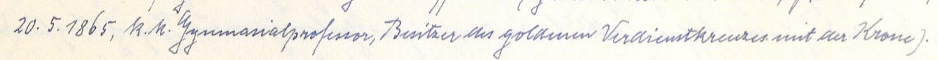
20.5.1865, k. k. Gymnasialprofessor, Besitzer des goldenen Verdienstkreuzes mit der Krone).
